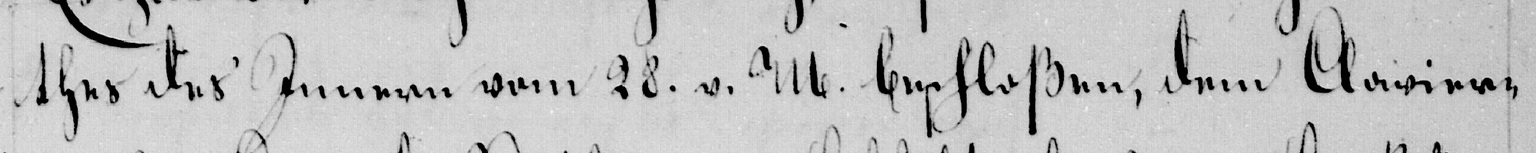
thes des Innern vom 28. v. M. beschloßen, dem Clavier¬
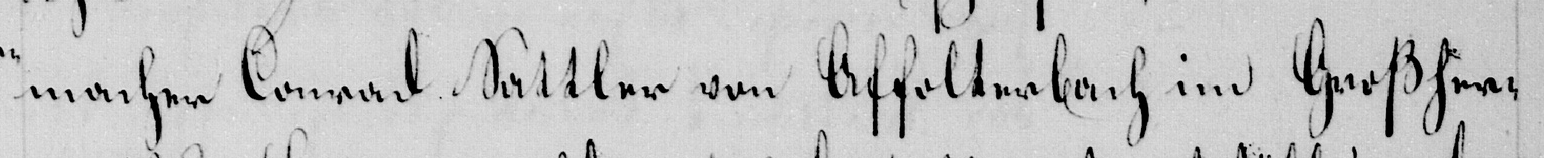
macher Conrad Sattler von Affolterbach im Großher¬
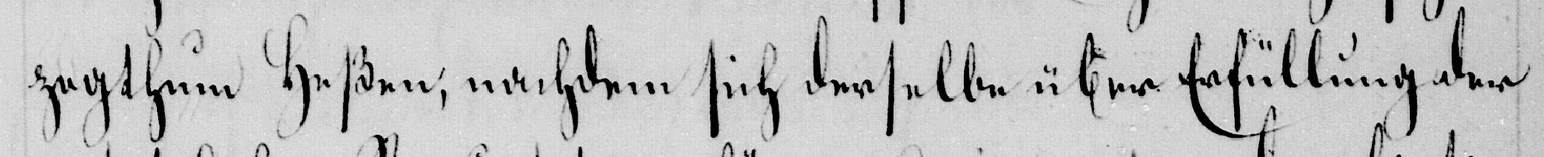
zogthum Heßen, nachdem sich derselbe über Erfüllung der
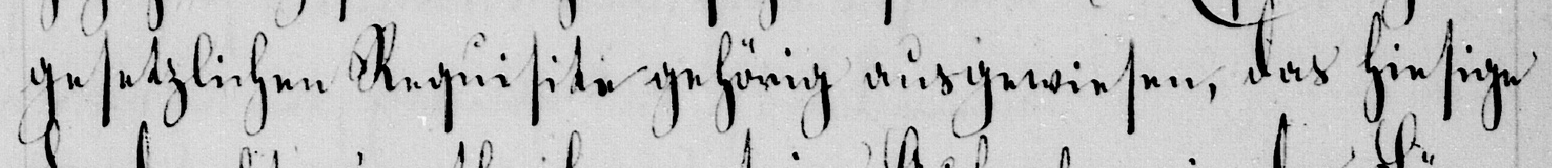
gesetzlichen Requisite gehörig ausgewiesen, das hiesige
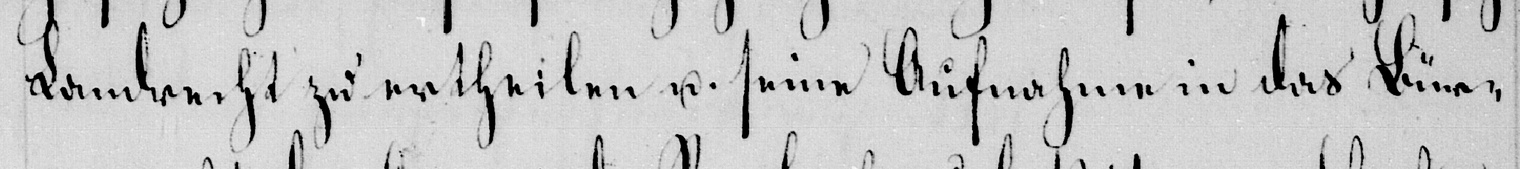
Landrecht zu ertheilen u. seine Aufnahme in das Bür¬
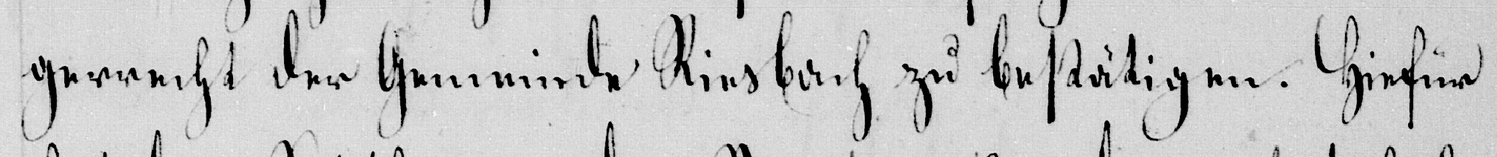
gerrecht der Gemeinde Riesbach zu bestätigen. Hiefür
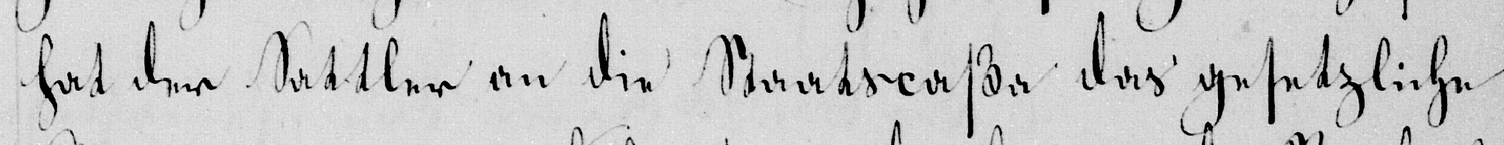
hat der Sattler an die Staatscaßa das gesetzliche
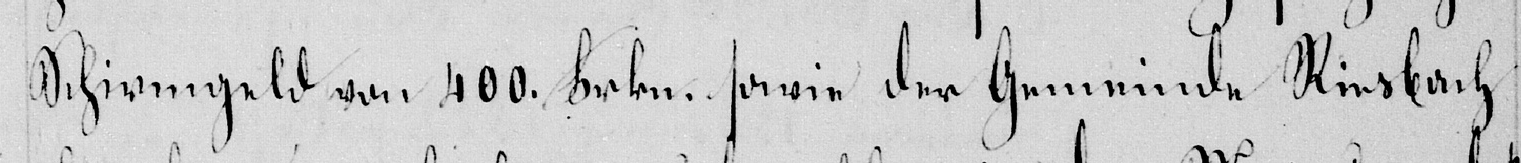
Schirmgeld von 400. Frkn. sowie der Gemeinde Riesbach
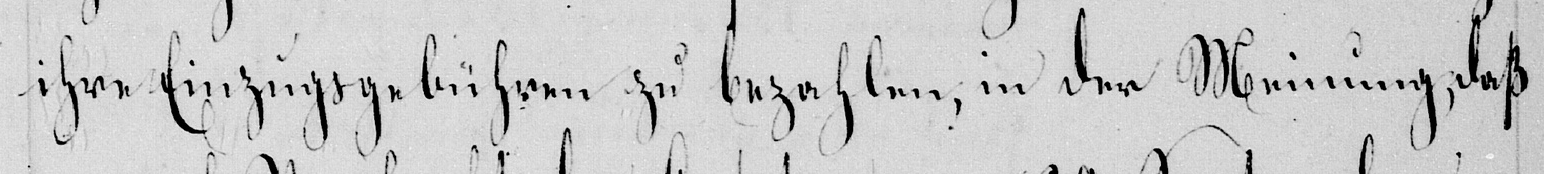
ihre Einzugsgebühren zu bezahlen, in der Meinung, daß
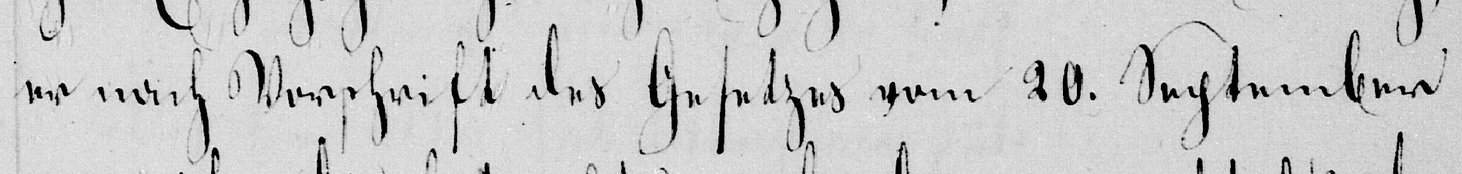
er nach Vorschrift des Gesetzes vom 20. September
